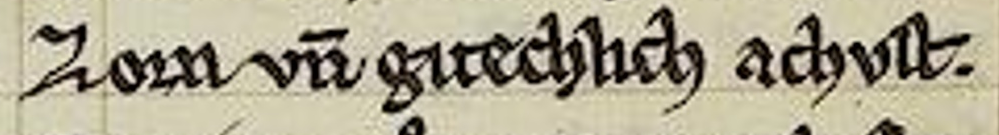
Zorn vn(d) gitechlich achvſt.
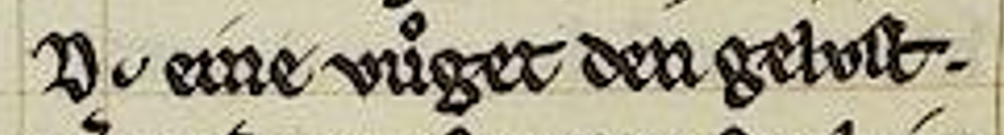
D(az) eine vu°oget den gelvſt.
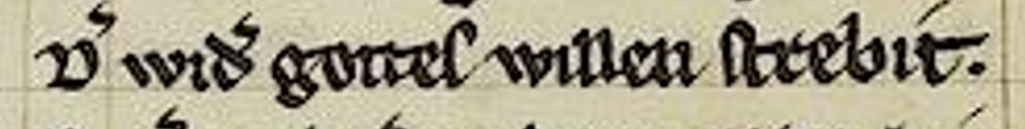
D(er) wid(er) gotteſ willen ſtrebit.
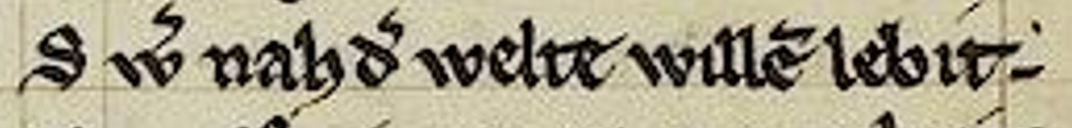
Sw(er) nah d(er) welte wille(n) lebit.
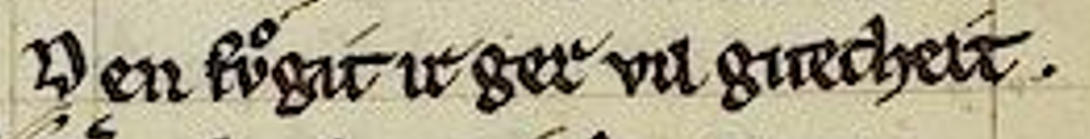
Den fv°ogit ir ger vil gitecheit.
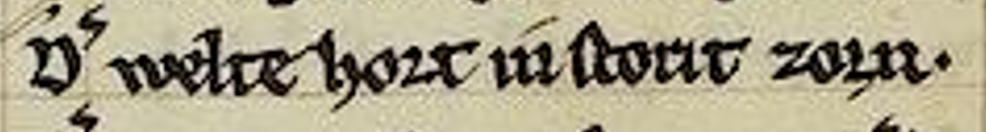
(b =) D(er) welte hort in ſtorit zorn.
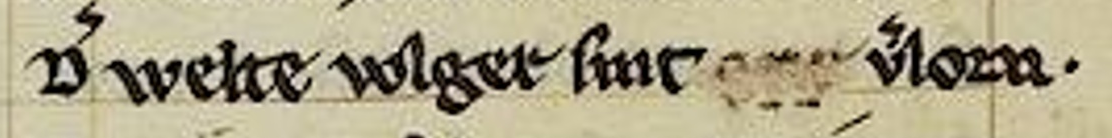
D(er) welte volger ſint xxx v(er)lorn.
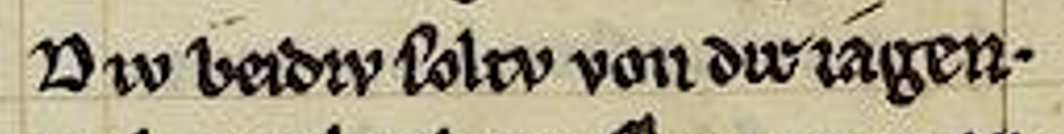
Div beidiv ſoltv von dir iagen.
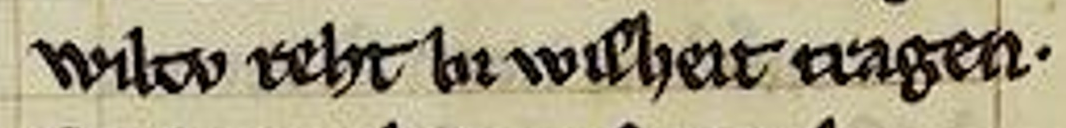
Wiltv reht bi wiſheit tragen.
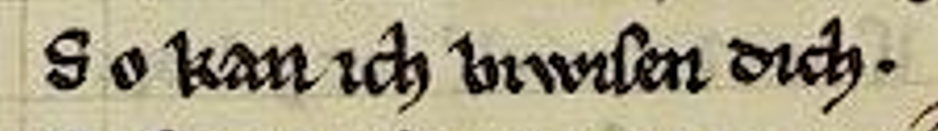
So kan ich biwiſin dich.
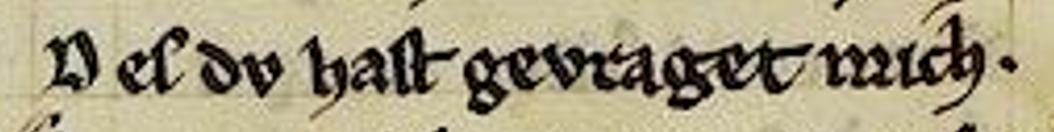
Deſ dv haſt gevraget mich.
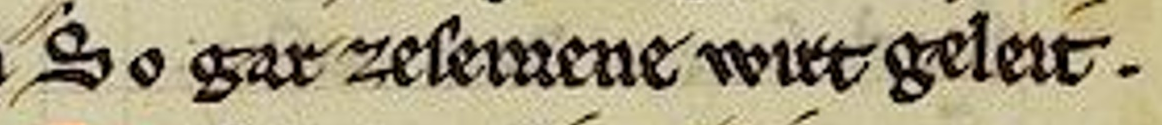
(a =) So gar zeſemene wirt geleit.
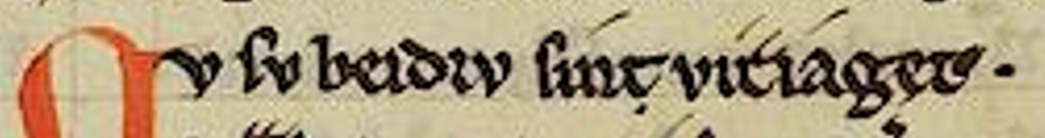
**Nv ſv beidiv ſint viriaget.
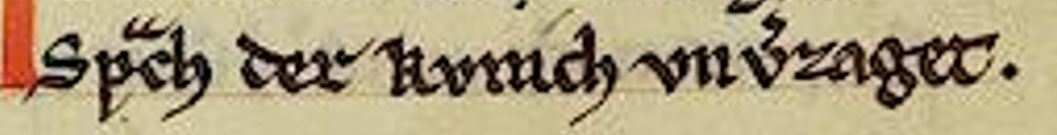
Sp(ra)ch der kvnich vnv(er)zaget.
